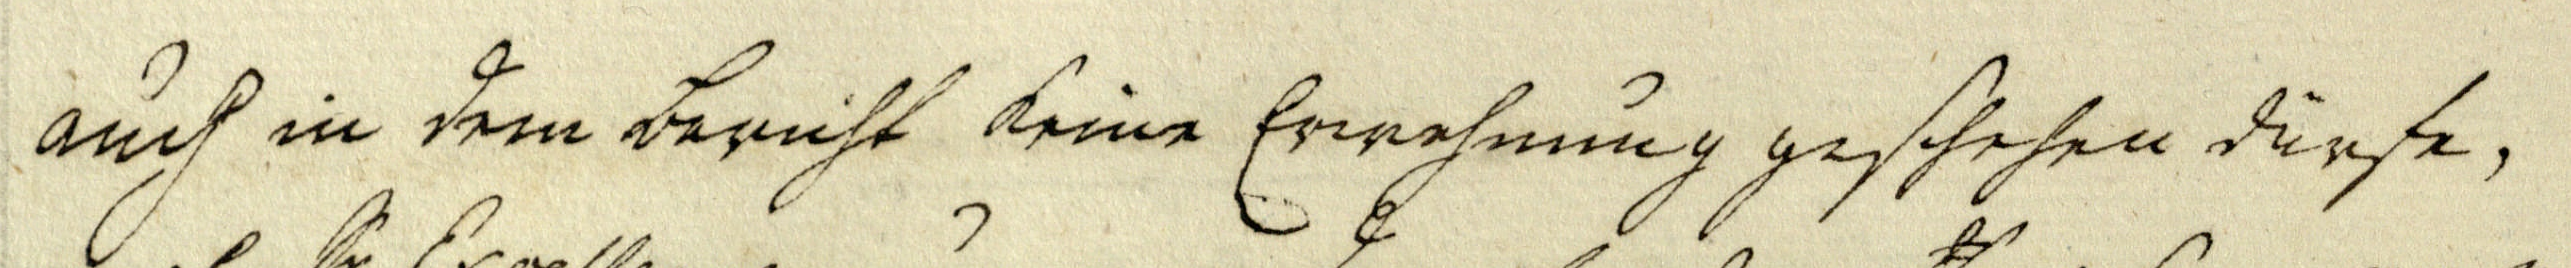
auch in dem Bericht keine Erwehnung geschehen dürfe,
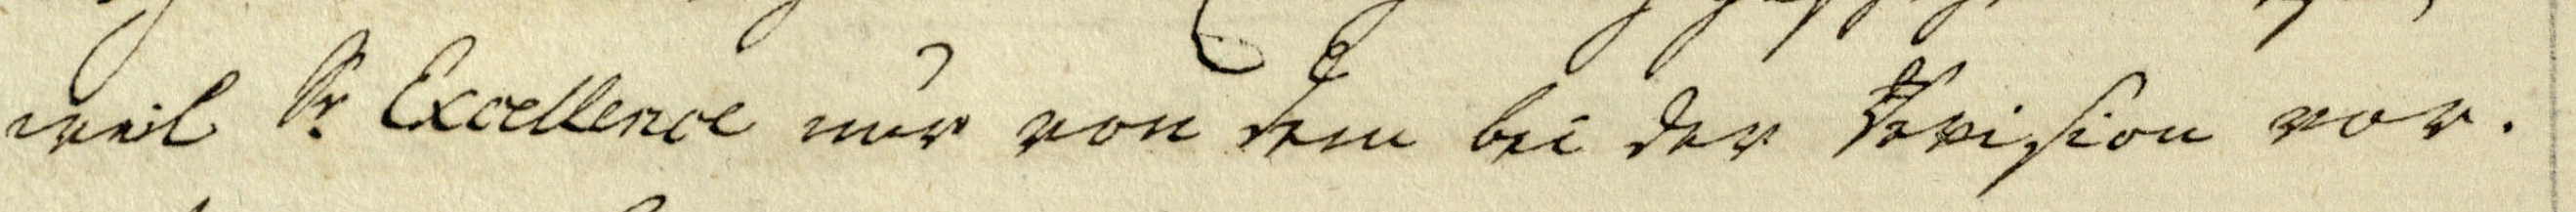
weil Sr Excellence nur von dem bei der Revision vor¬
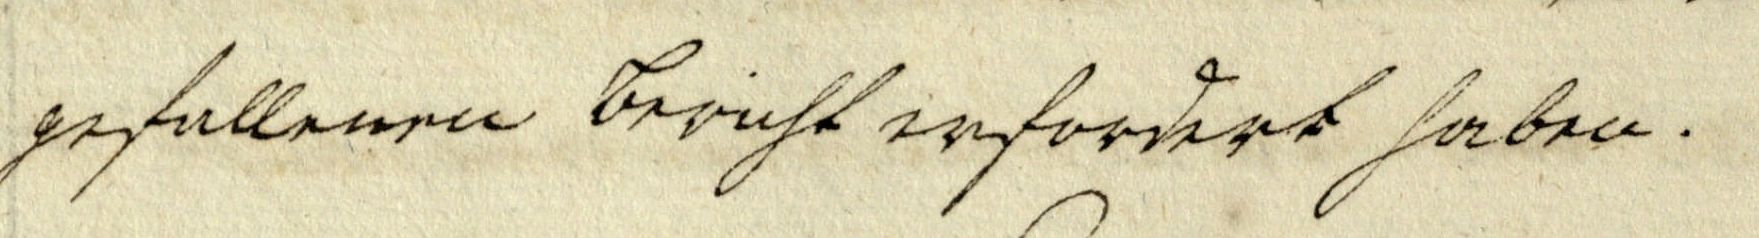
gefallenen Bericht erfordert haben.
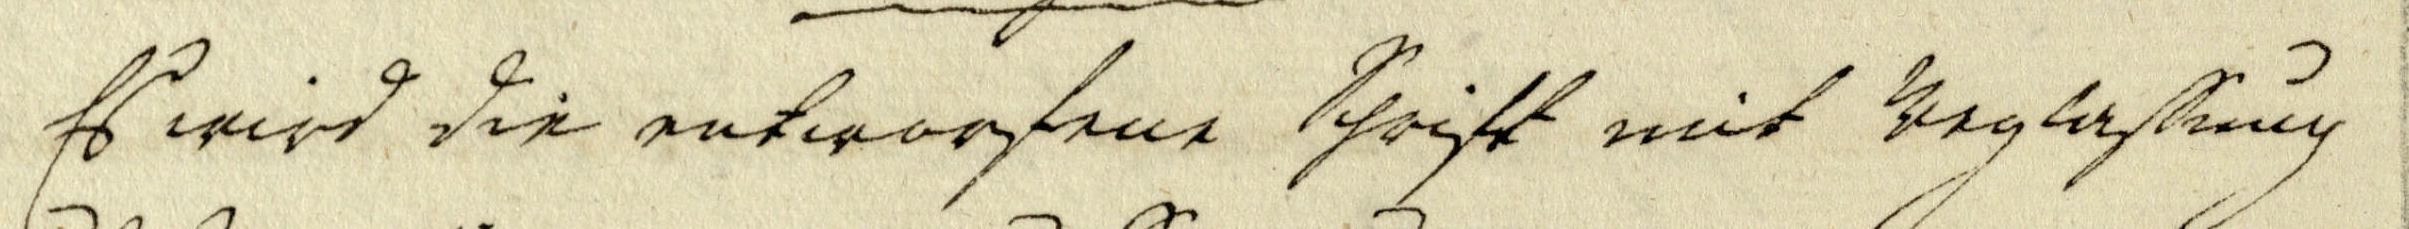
Es wird die entworfene Schrift mit Weglassung
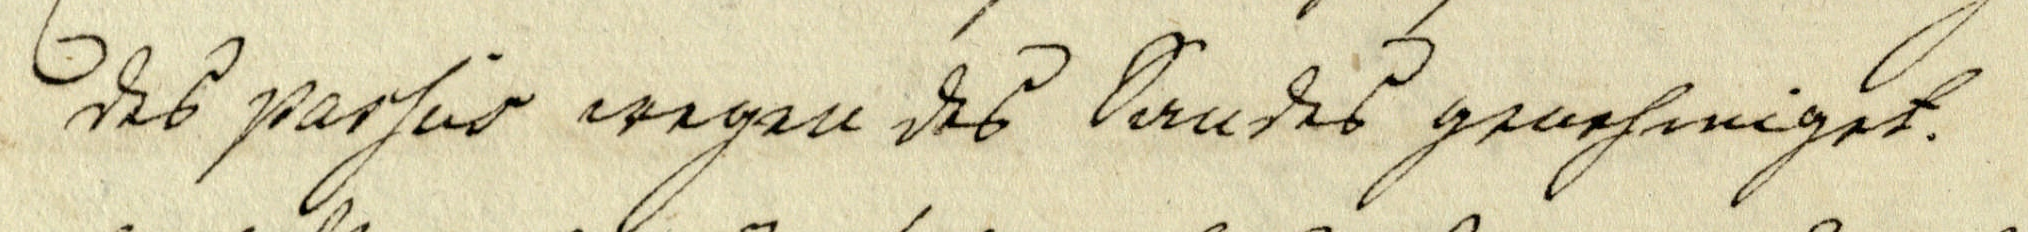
des passus wegen des Sandes genehmiget.
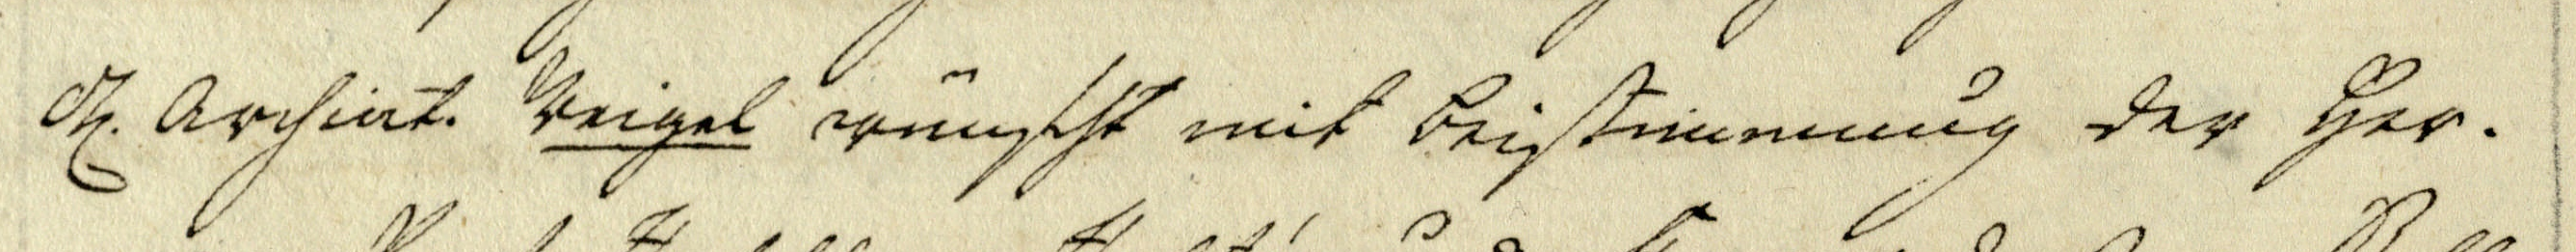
dh. Archiat. Weigel wünscht mit Beistimmung der Her¬
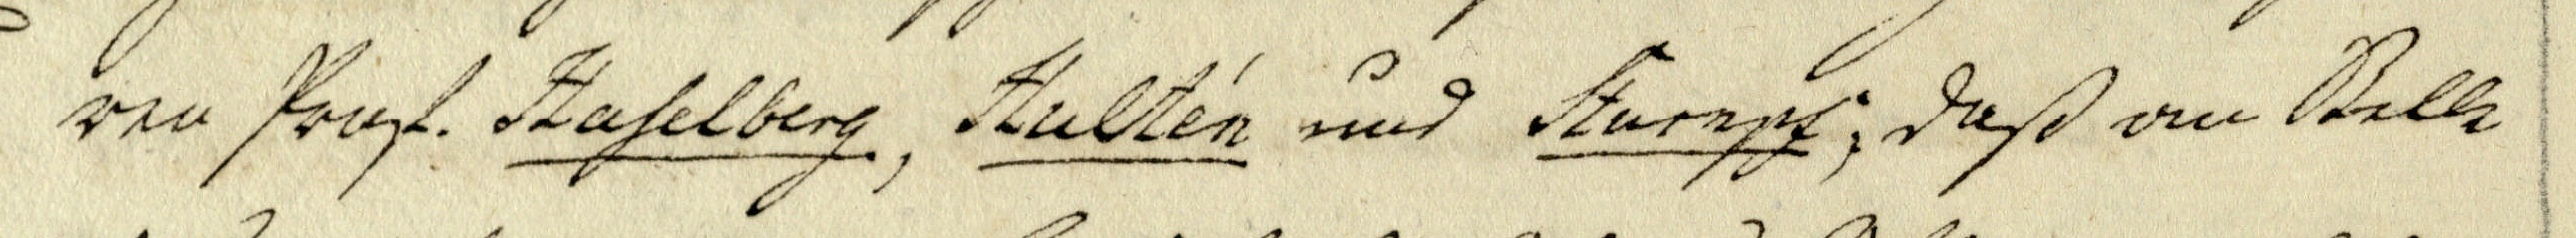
ren Prof. Haselberg, Hultén und Stumpf, daß an Stelle
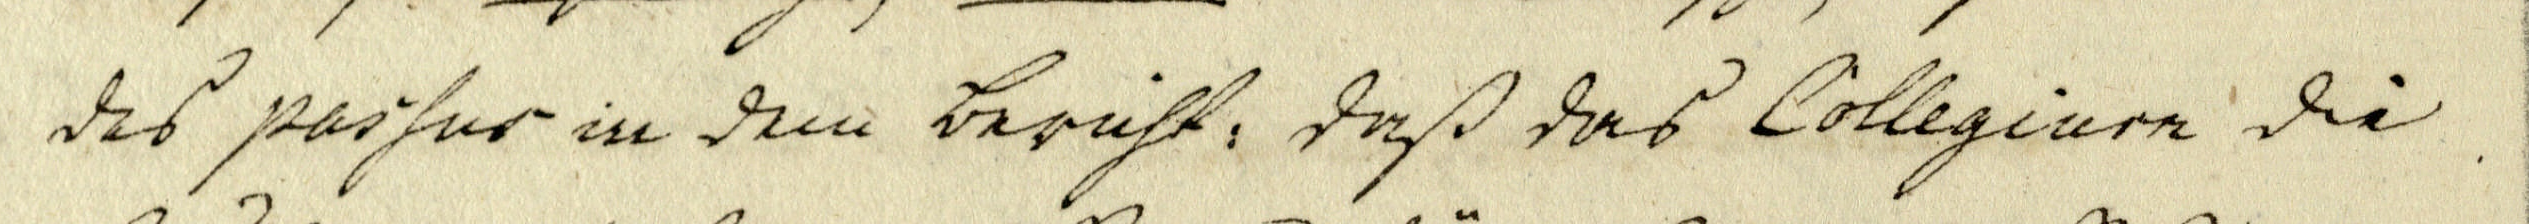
des passus in dem Bericht: daß das Collegium die
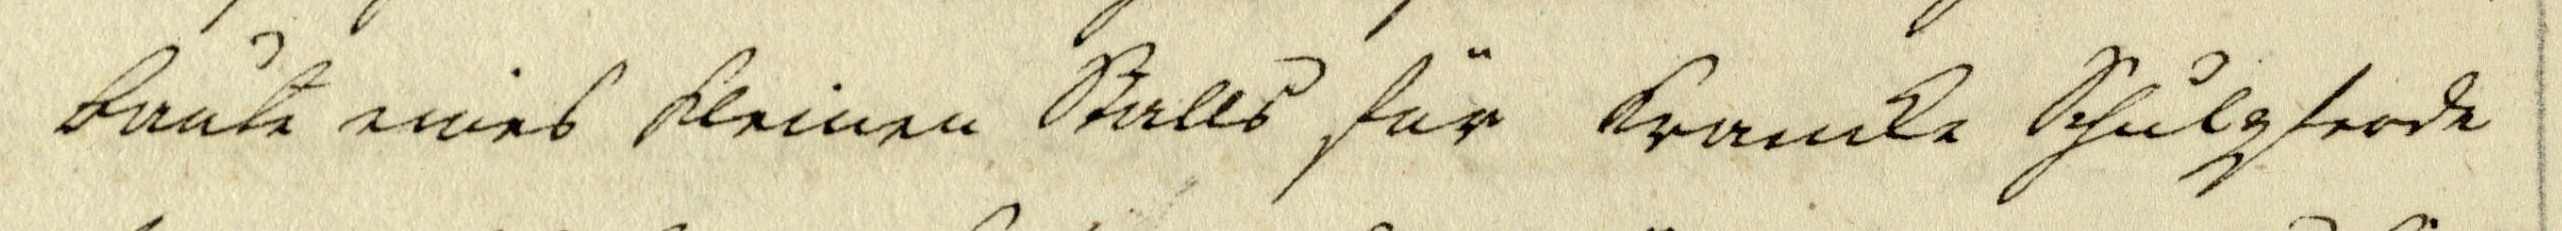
Baute eines kleinen Stalls für krancke Schulpferde
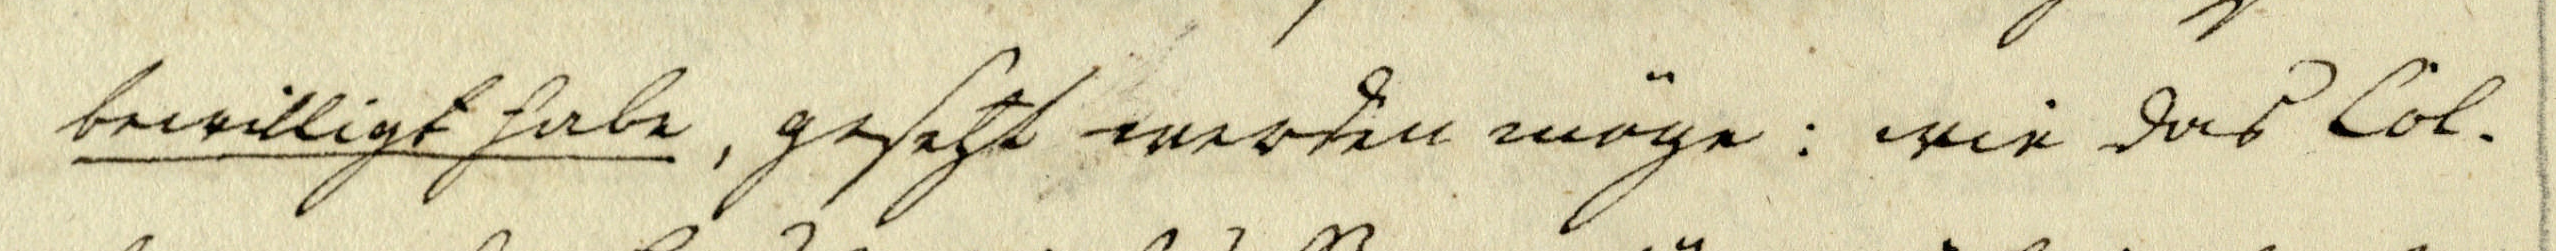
bewilligt habe, gesetzt werden möge: wie das Col¬
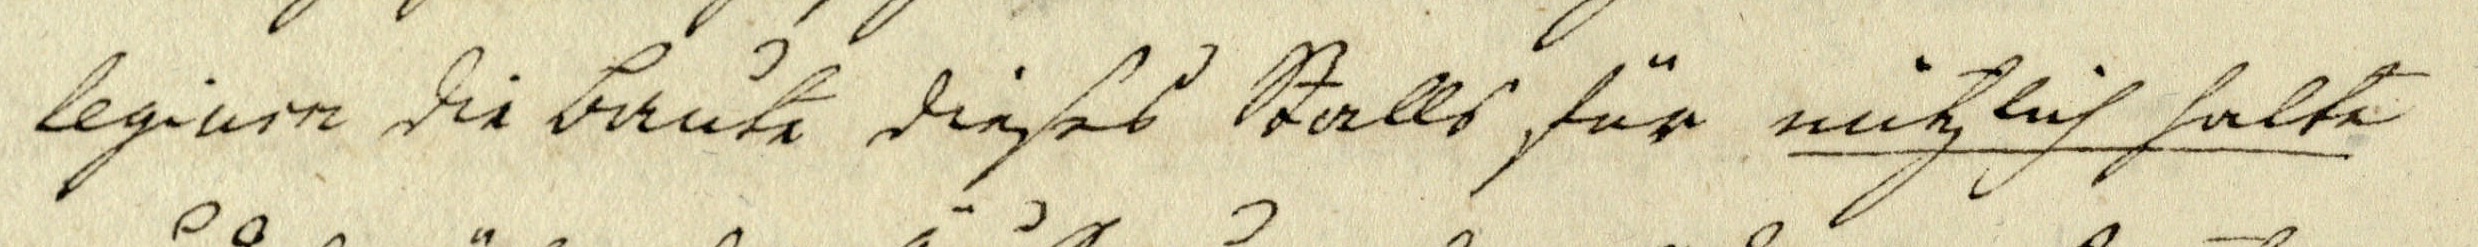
legium die Baute dieses Stalls für nützlich halte
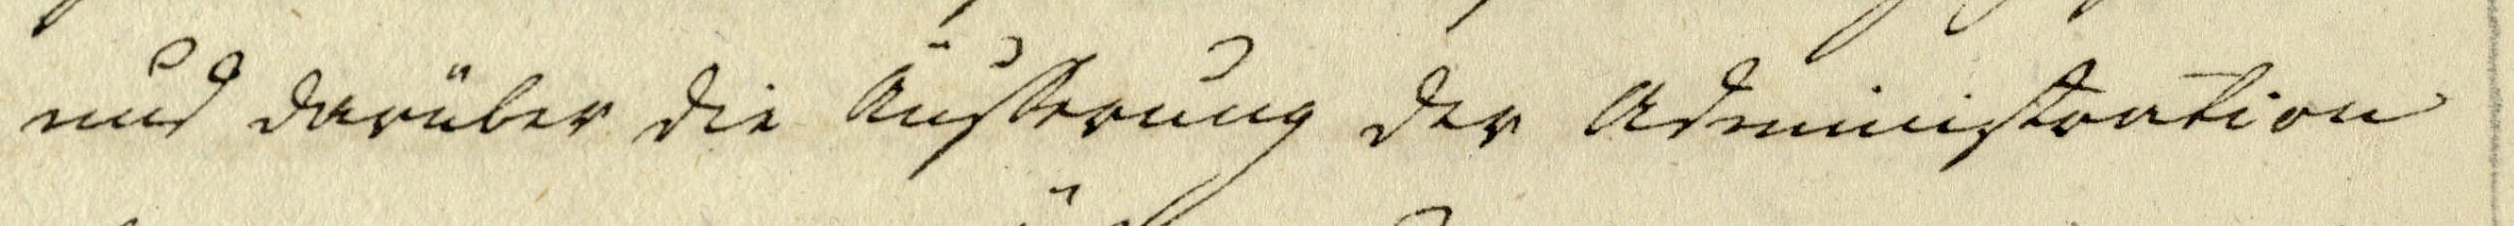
und darüber die Äusserung der Administration
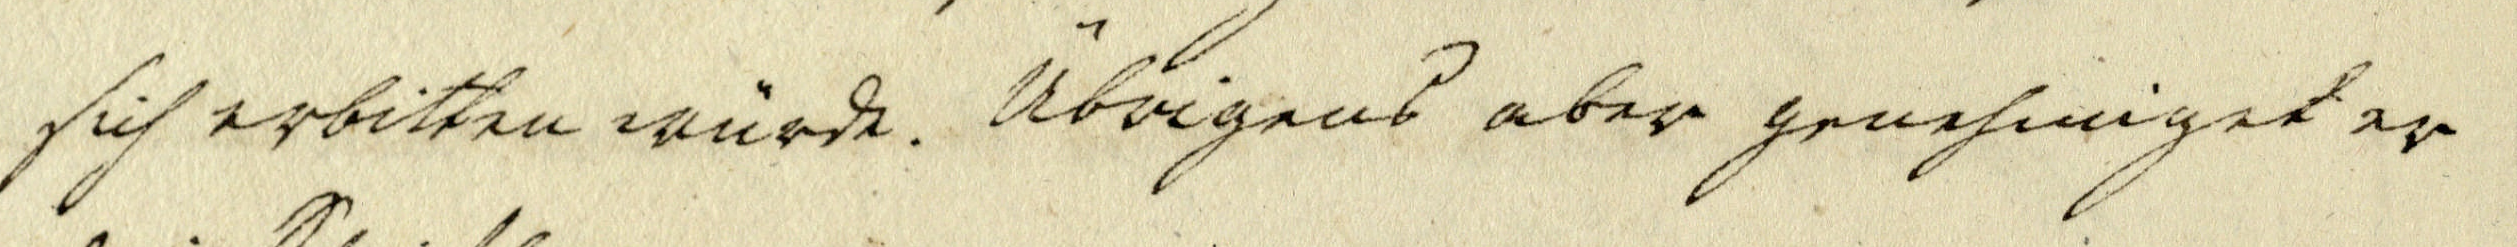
sich erbitten würde. Übrigens aber genehmiget er
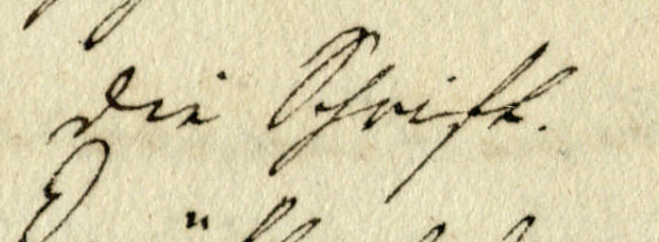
die Schrift.
